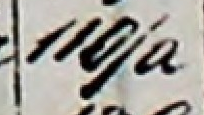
110/a
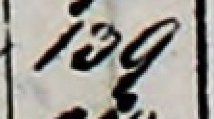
139
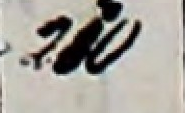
2?0
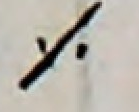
./.
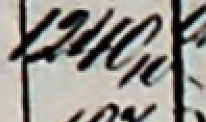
1240,0
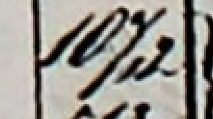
107,2
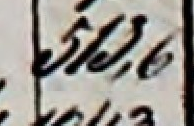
513,6
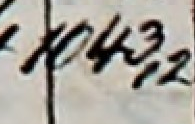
1043,2
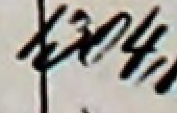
1304,1
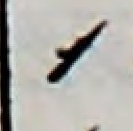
1
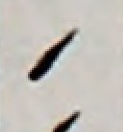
1
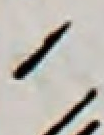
1
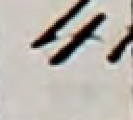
4
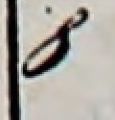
8
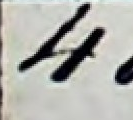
4
